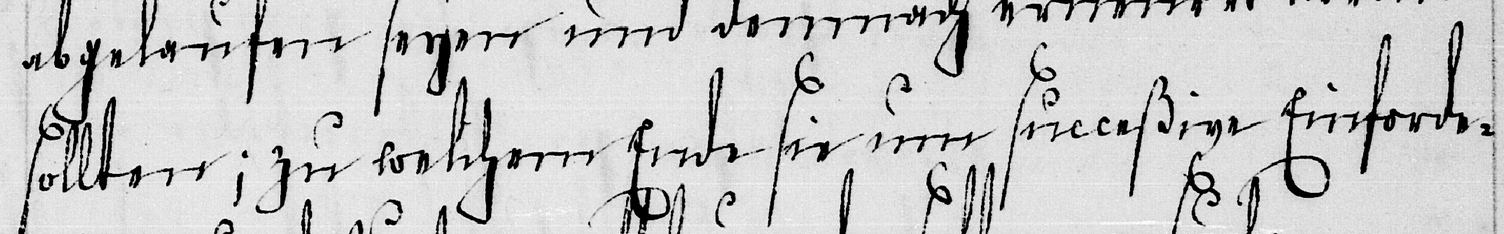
sollten; zu welchem Ende sie um succeßive Einforde¬
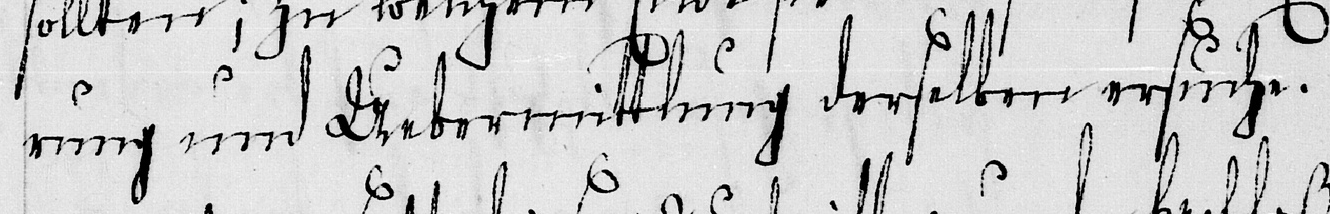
rung und Uebermittlung derselben ersuche.
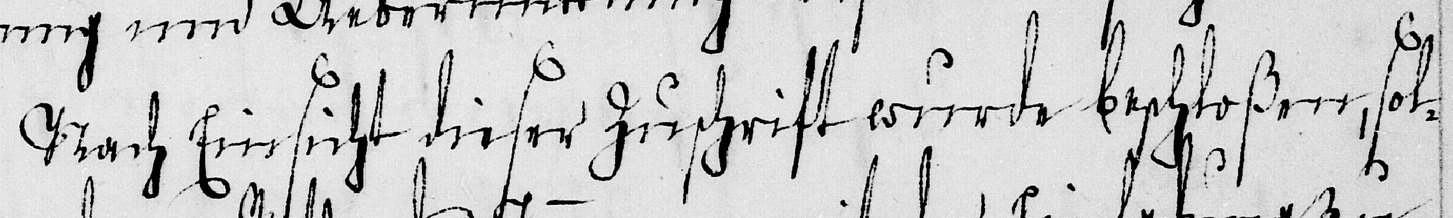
Nach Einsicht dieser Zuschrift wurde beschloßen, sol¬
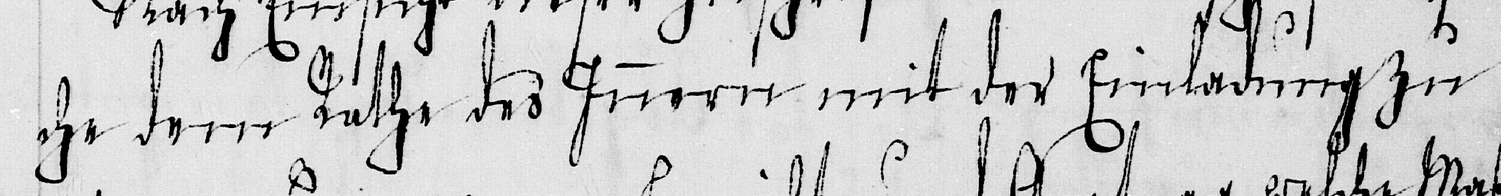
che dem Rathe des Innern mit der Einladung zu
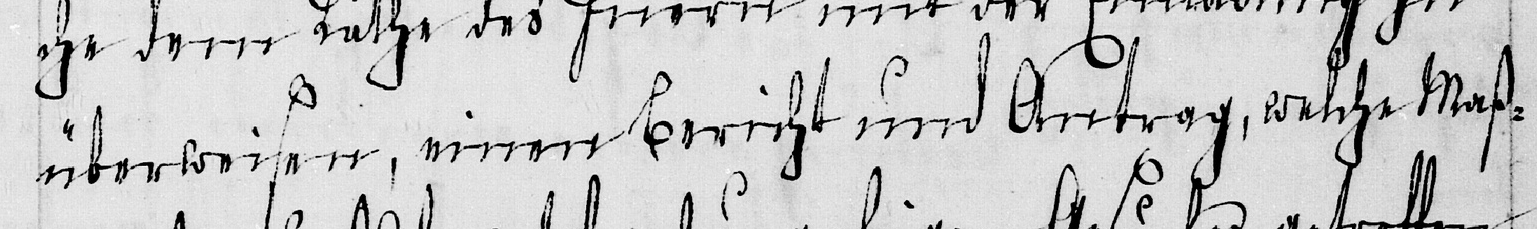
überweisen, einen Bericht und Antrag, welche Maß¬
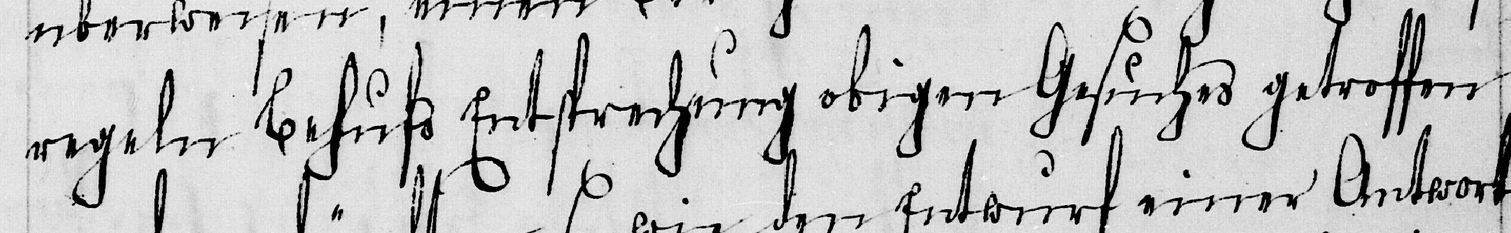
regeln Behufs Entsprechung obigen Gesuches getroffen
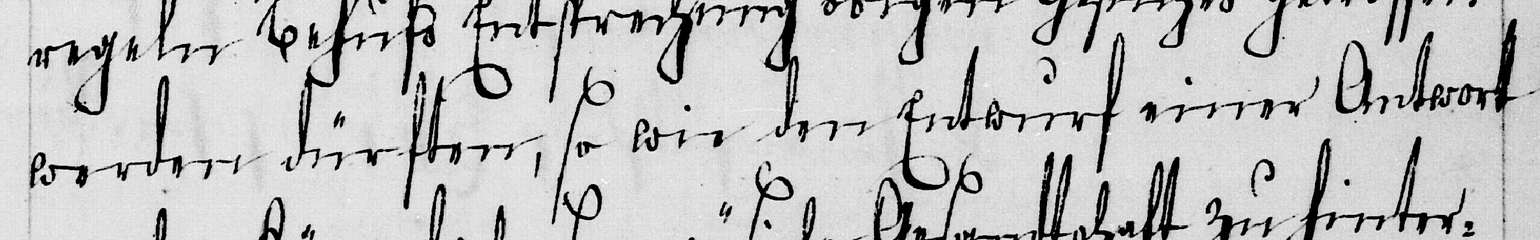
werden dürften, so wie den Entwurf einer Antwort
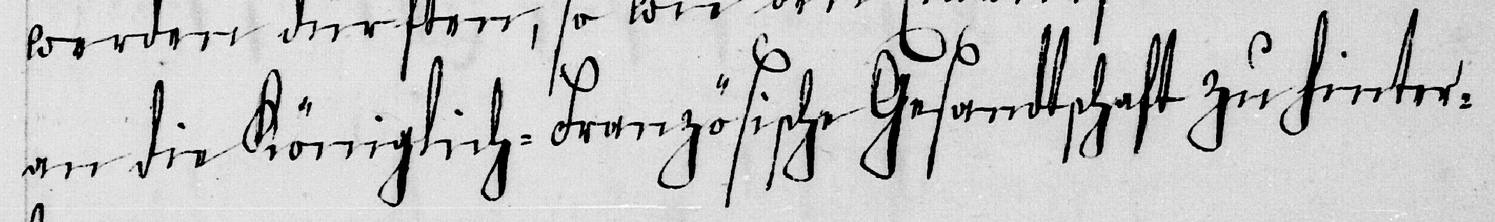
an die Königlich-Französische Gesandtschaft zu hin¬
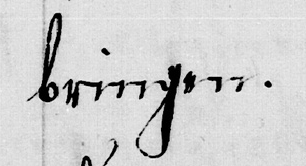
bringen.
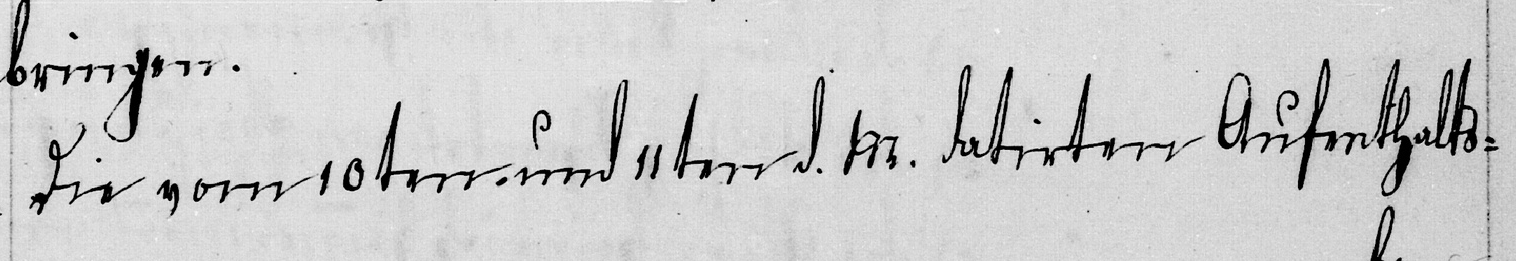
Die vom 10ten und 11ten d. M. datirten Aufenthalts
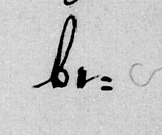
ter¬
